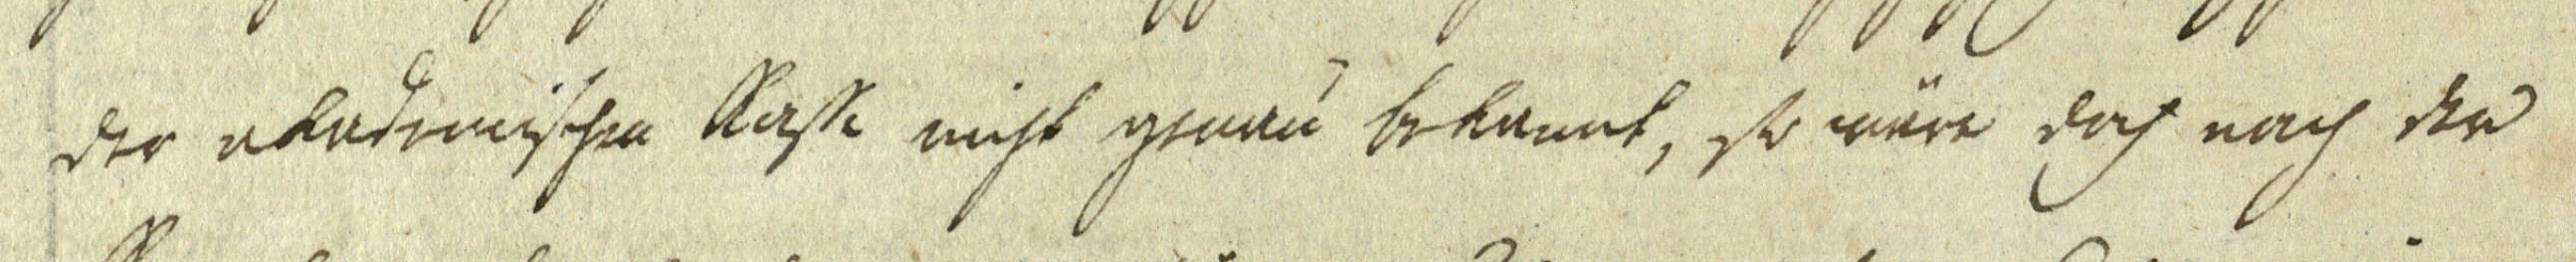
der akademischen Kasse nicht genau bekannt, so wäre doch nach der
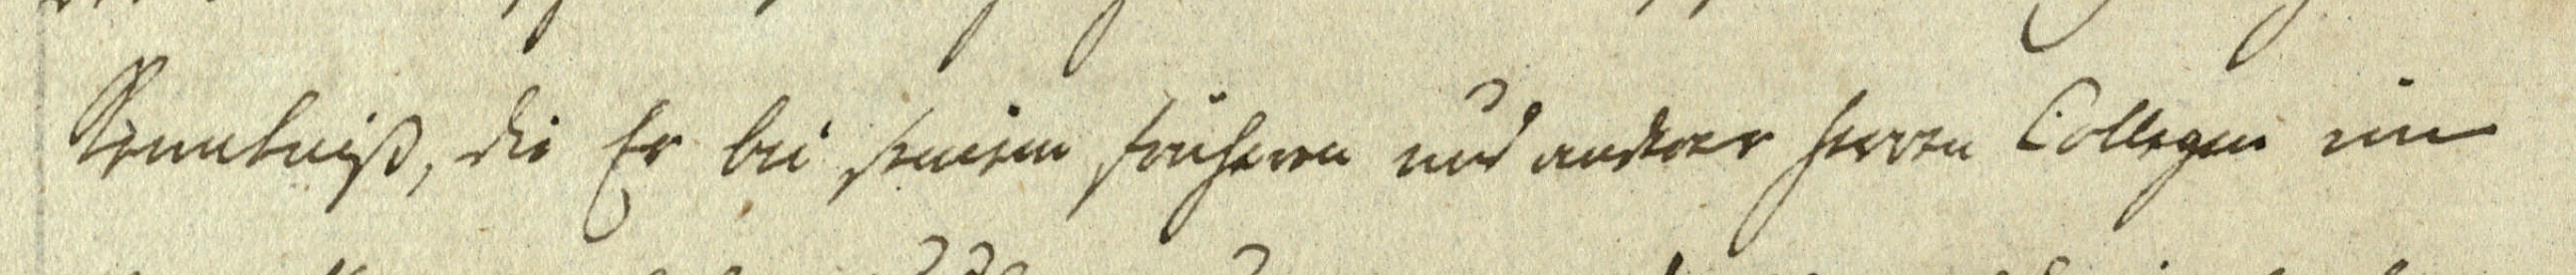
Kenntniß, die Er bei seinen früheren und anderer Herren Collegen im
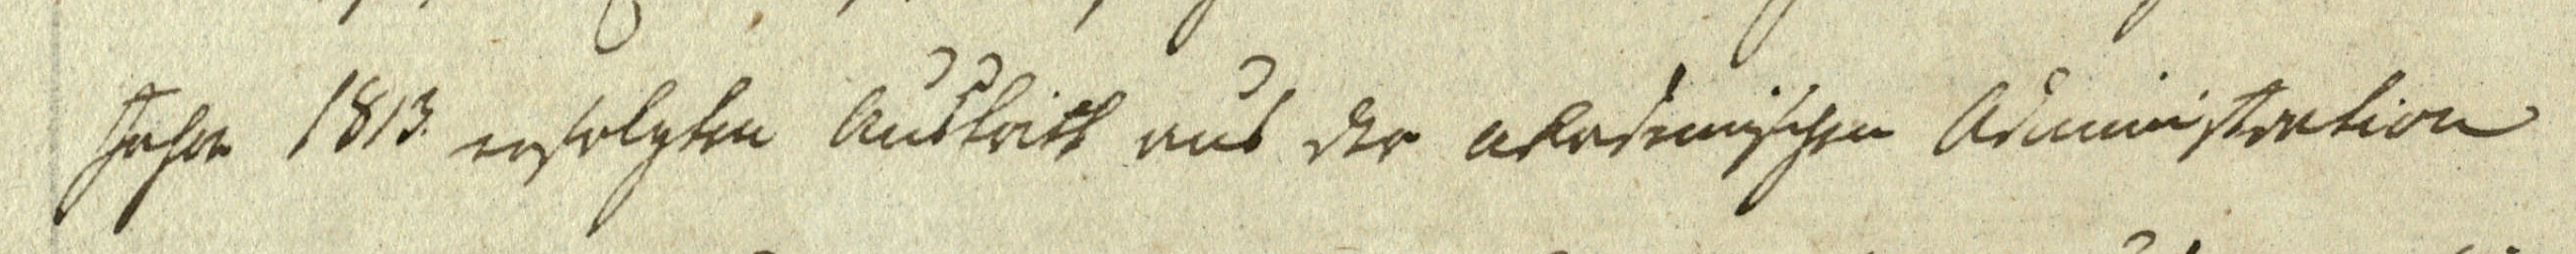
Jahr 1813 erfolgten Austritt aus der akademischen Administration
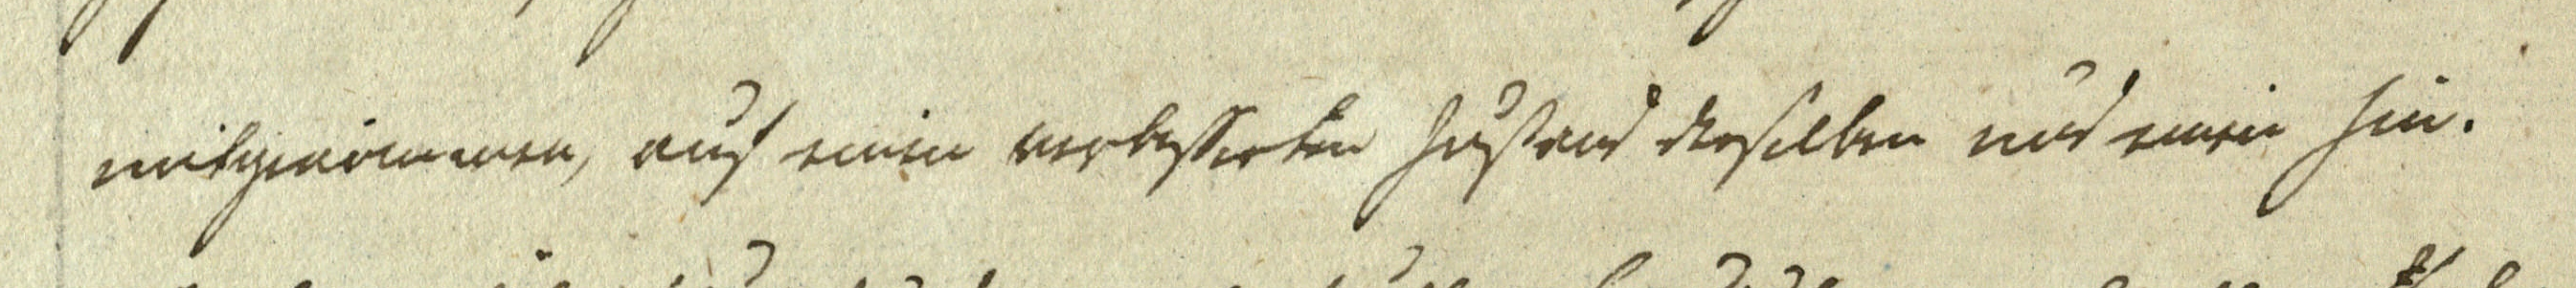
mitgenömmen, auf einen verbesserten Zustand derselben und einen hin¬
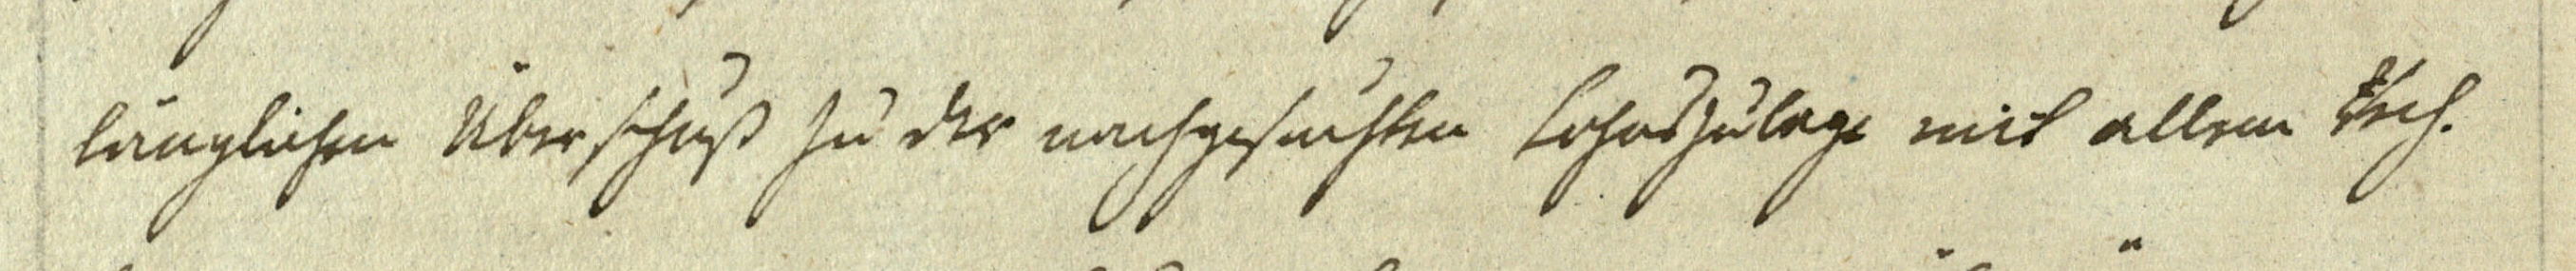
länglichen Überschuß zu der nachgesuchten Lohnszulage mit allem Rech¬
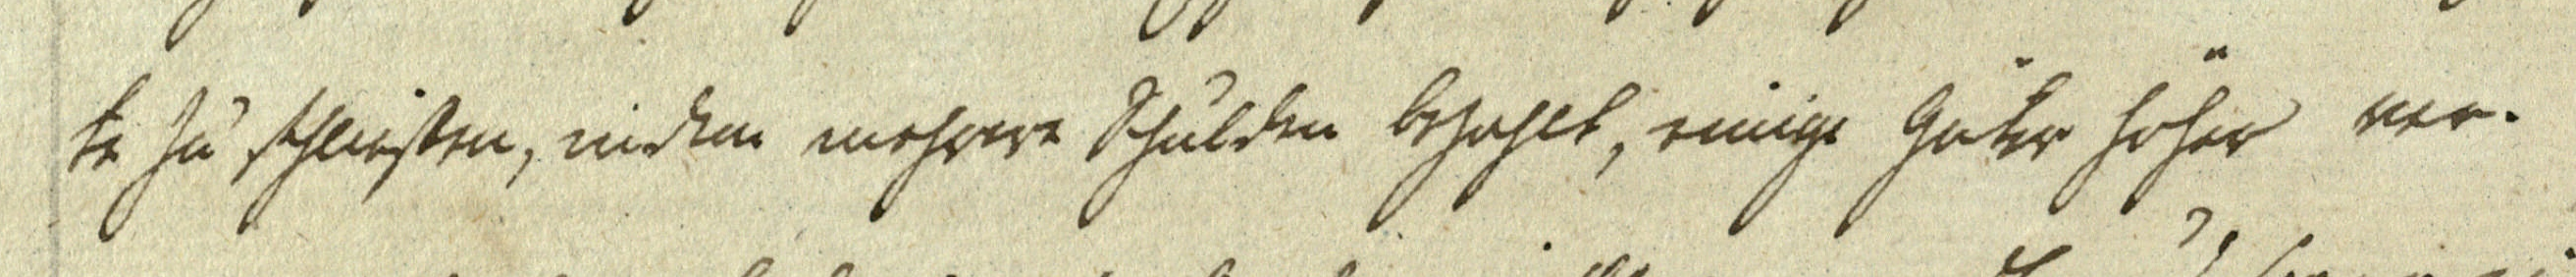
te zu schließen, indem mehrere Schulden bezahlt, einige Güter höher ver¬
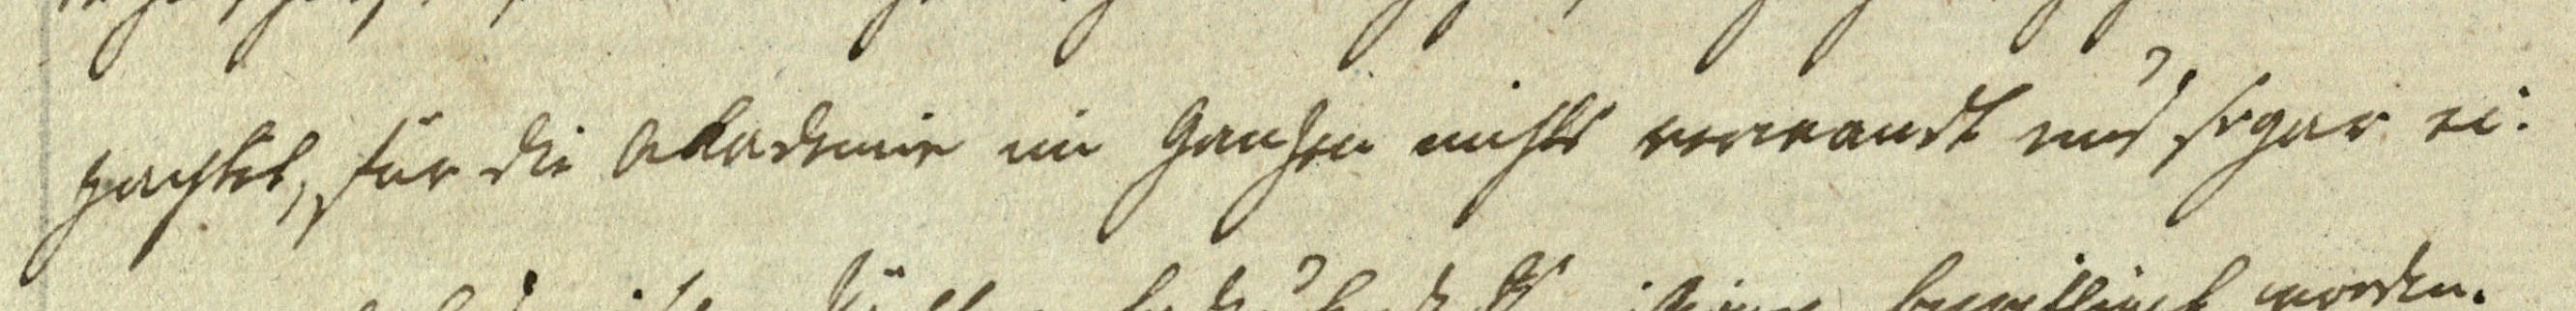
pachtet, für die Akademie im Ganzen nichts verwandt und sogar ei¬
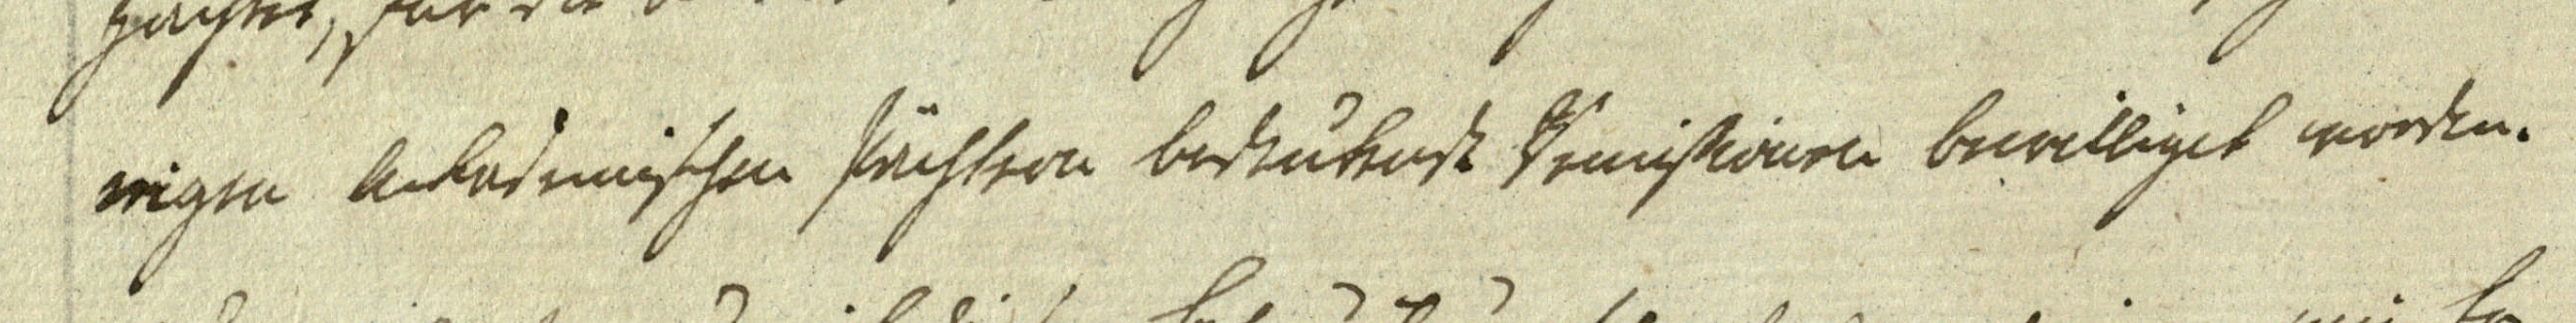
nigen Akademischen Pächtern bedeutende Remissionen bewilliget worden.
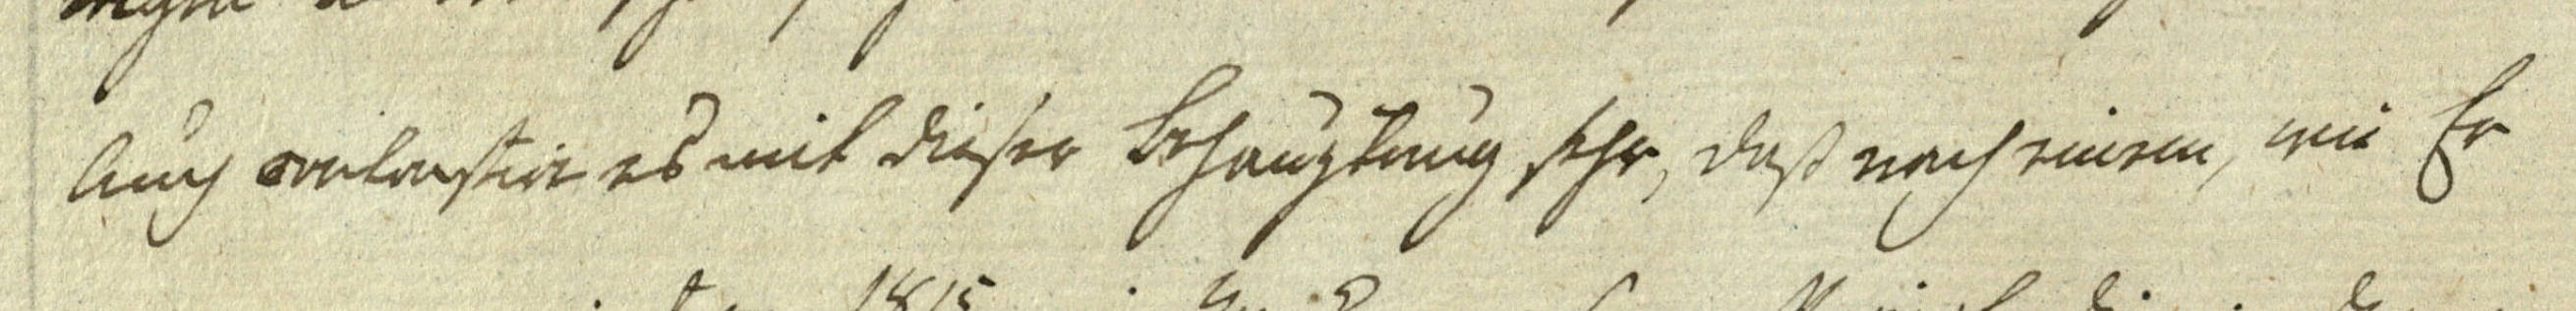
Auch contrastire es mit dieser Behauptung sehr, daß nach einem, wie Er
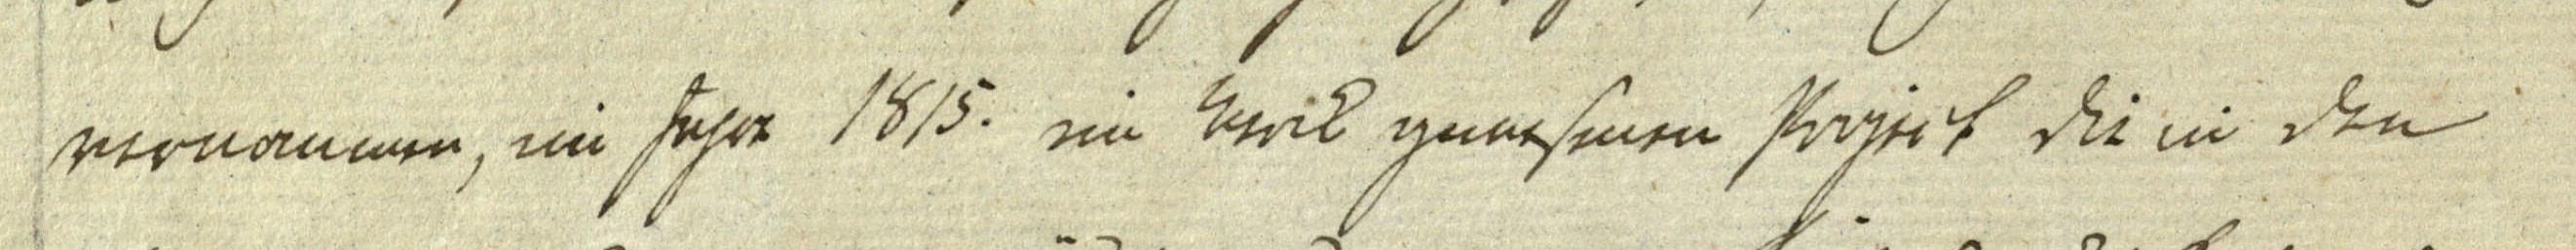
vernommen, im Jahre 1815. im Werck gewesenen Project die in den
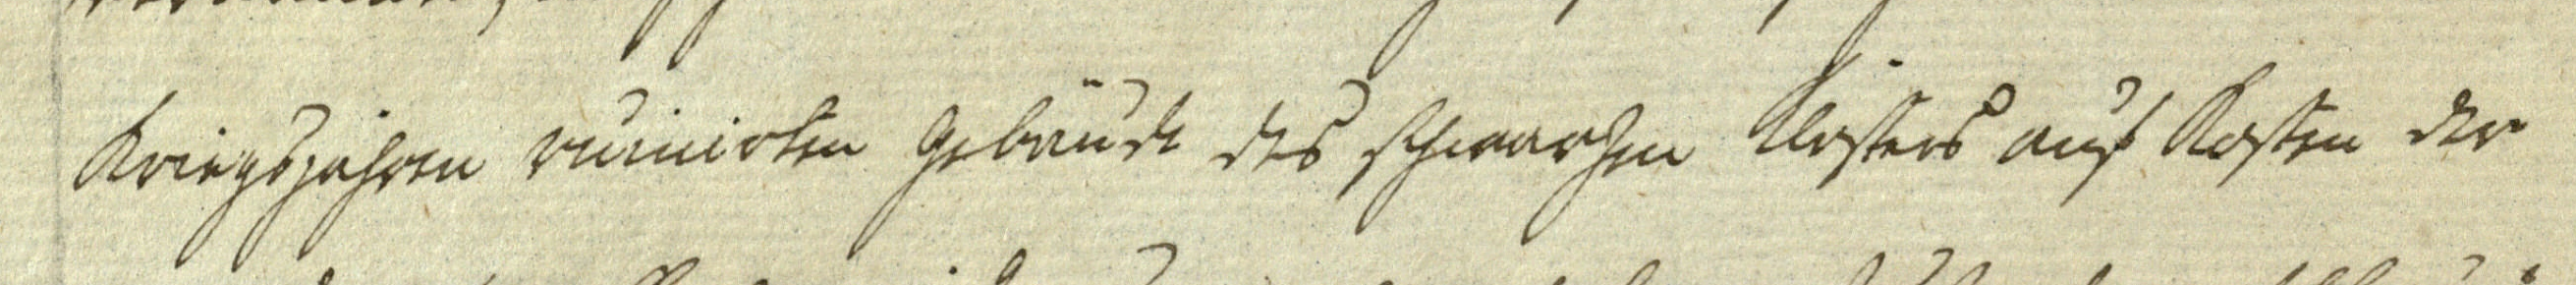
Kriegsjahren ruinirten Gebäude des schwarzen Klosters auf Kosten der
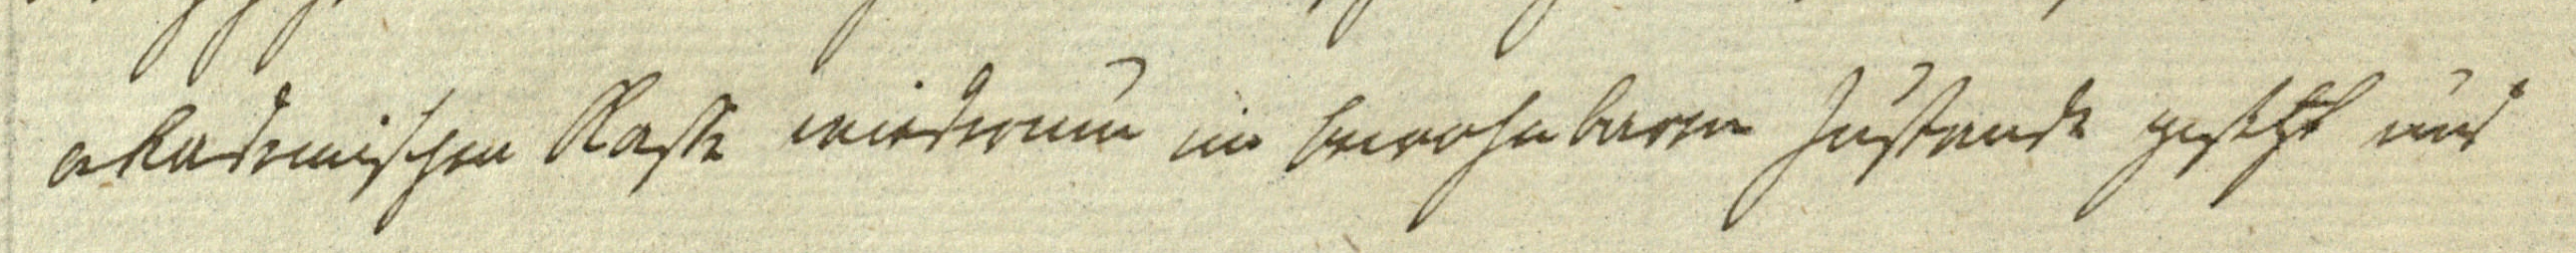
akademischen Kasse wiederum im bewohnbaren Zustande gesetzt und
